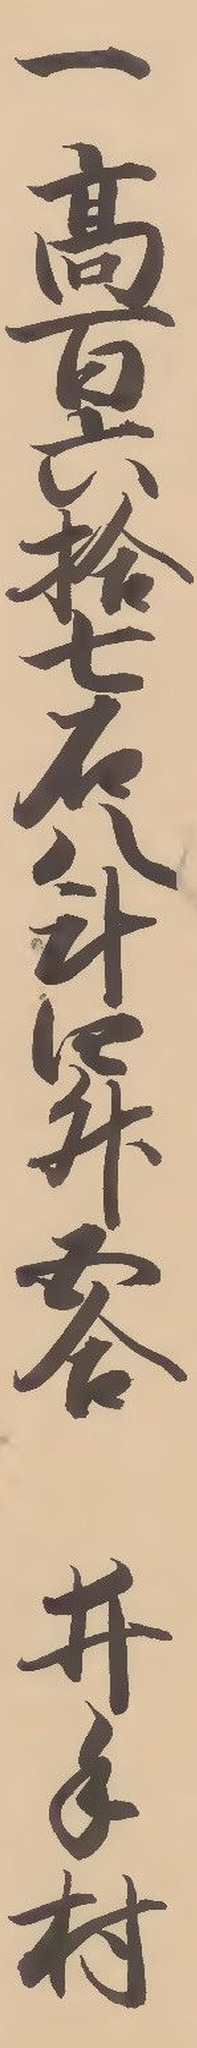一高百六拾七石八斗四升五合井手村
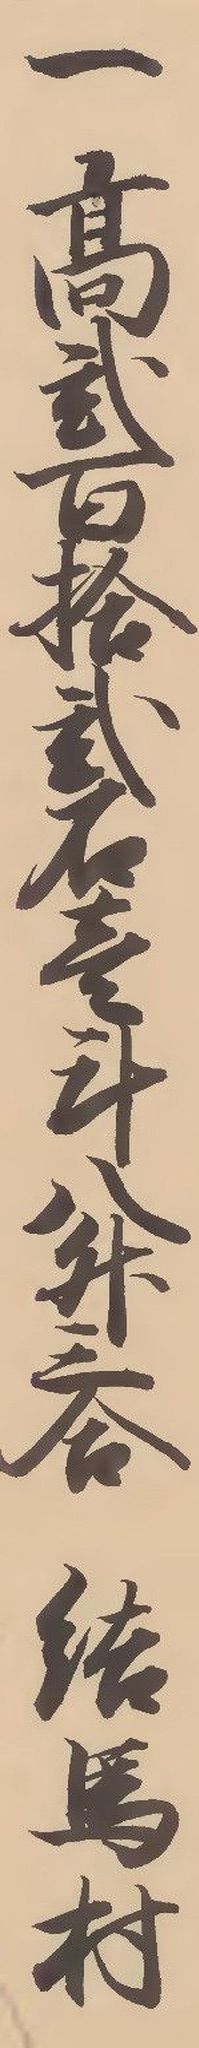一高弐百拾弐石壱斗八升三合結馬村
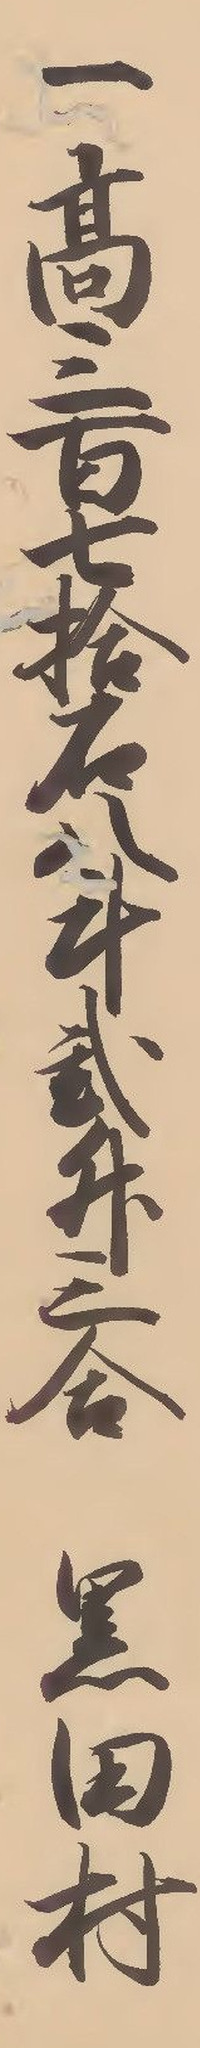一高三百七拾石八斗弐升三合黒田村

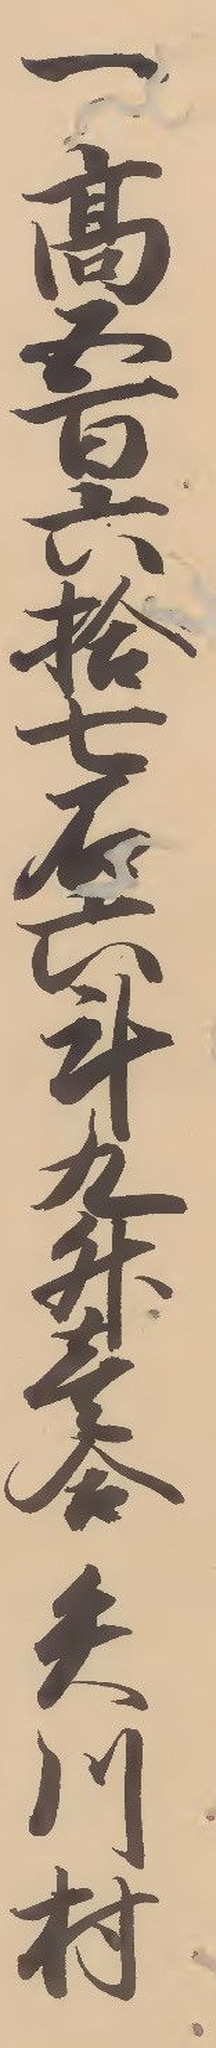一高五百六拾七石六斗九升壱合矢川村
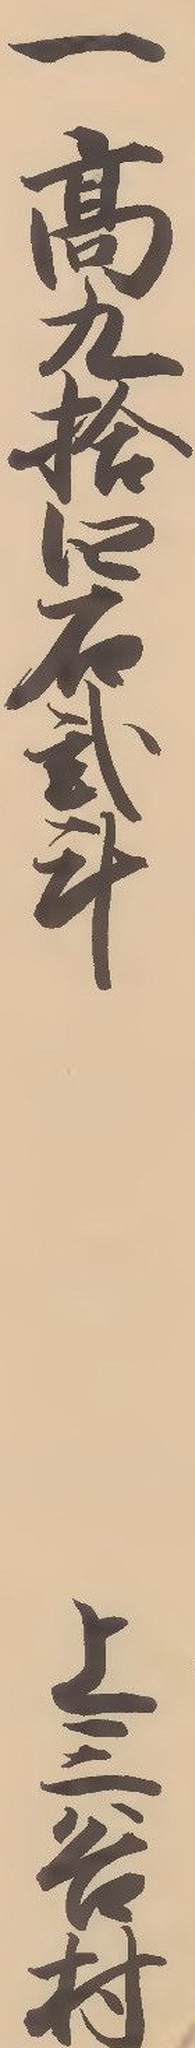一高九拾四石弐斗上三谷村
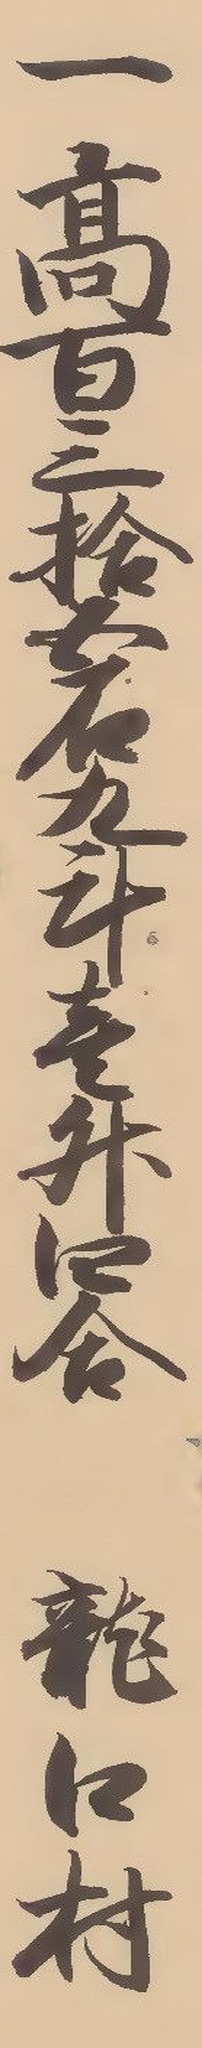一高百三拾五石九斗壱升四合龍口村
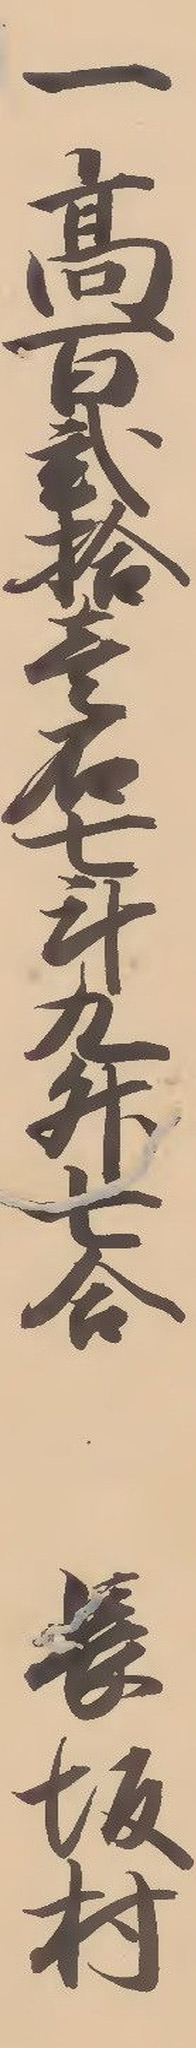一高百弐拾壱石七斗九升七合長坂村
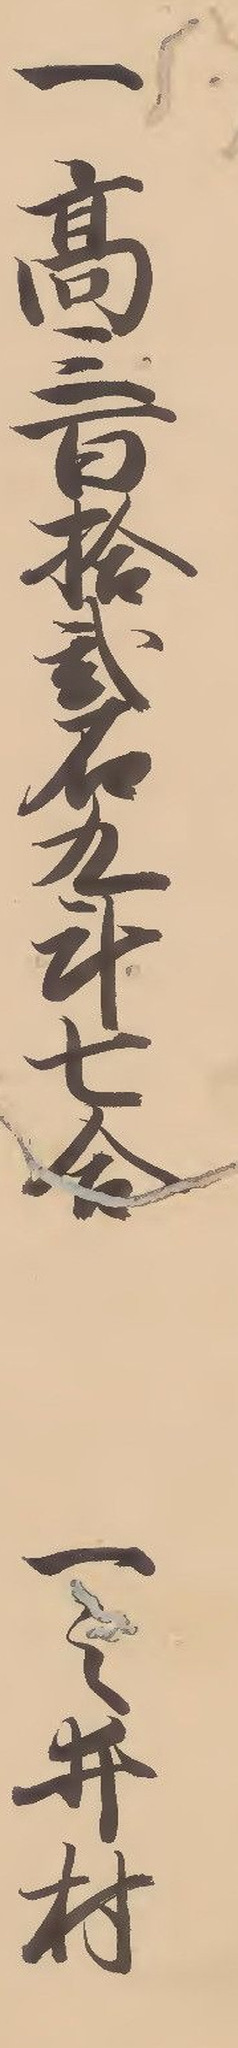一高三百拾弐石九斗七合一之井村
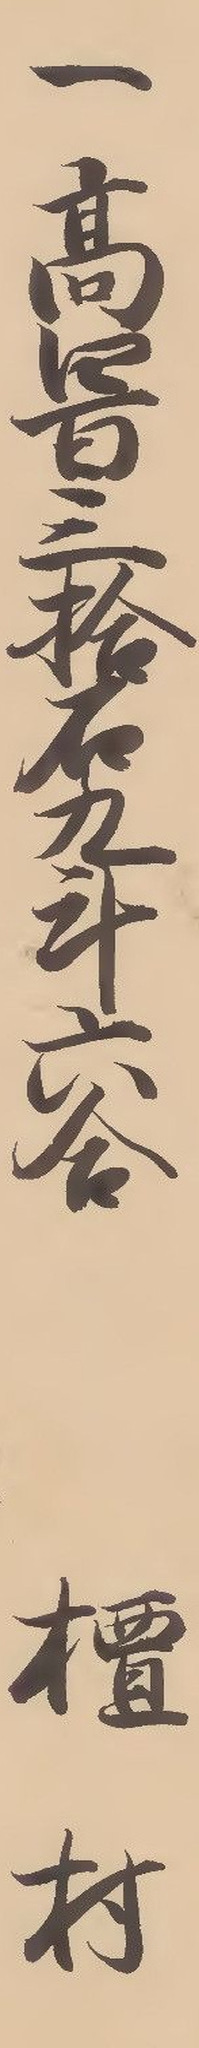一高四百三拾石九斗六合檀村
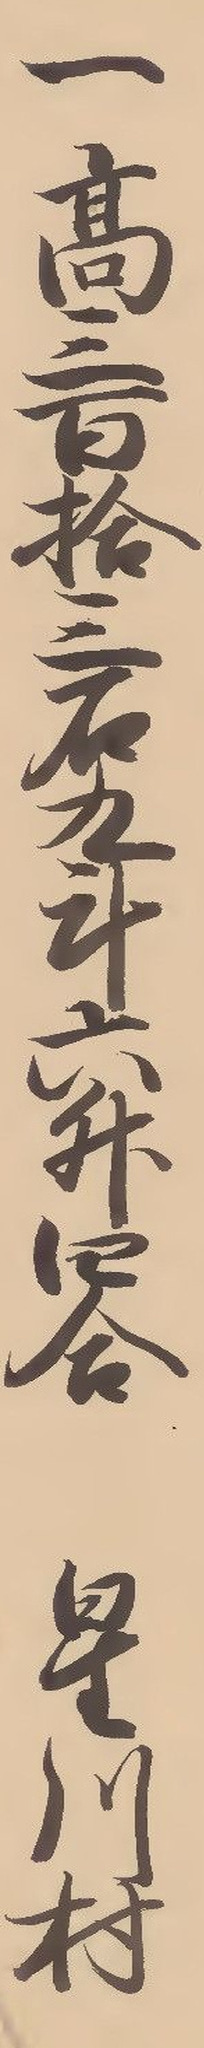一高三百拾三石九斗六升四合星川村
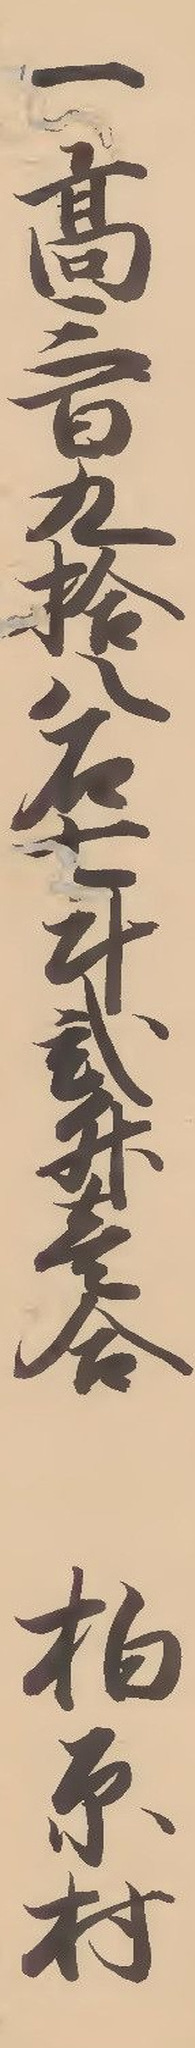一高三百九拾八石七斗弐升壱合柏原村

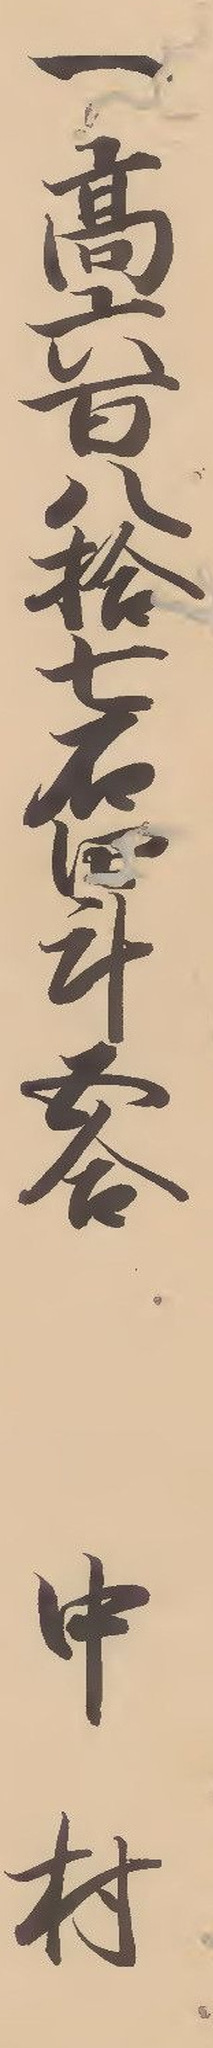一高六百八拾七石四斗五合中村
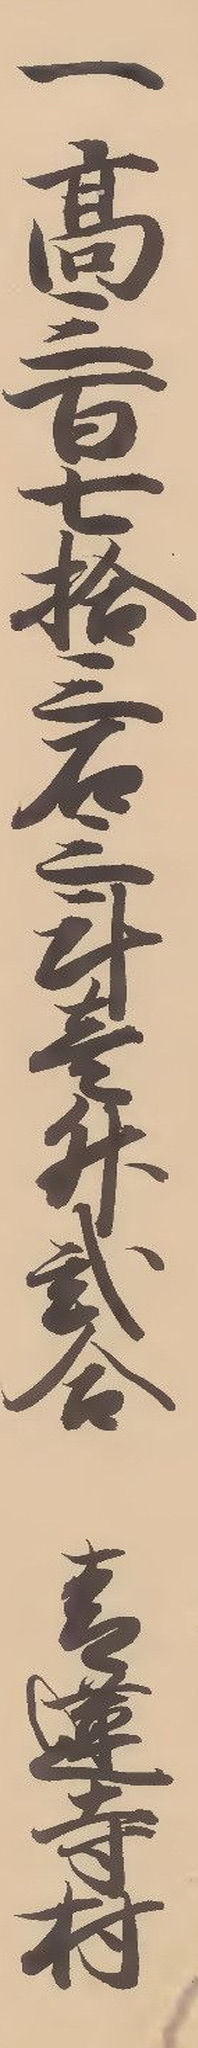一高三百七拾三石三斗壱升弐合青蓮寺村
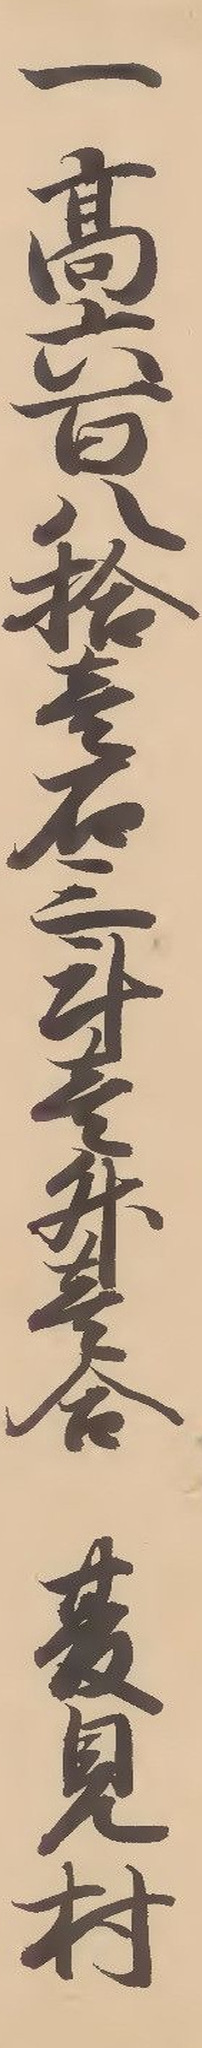一高六百八拾壱石三斗壱升壱合夏見村
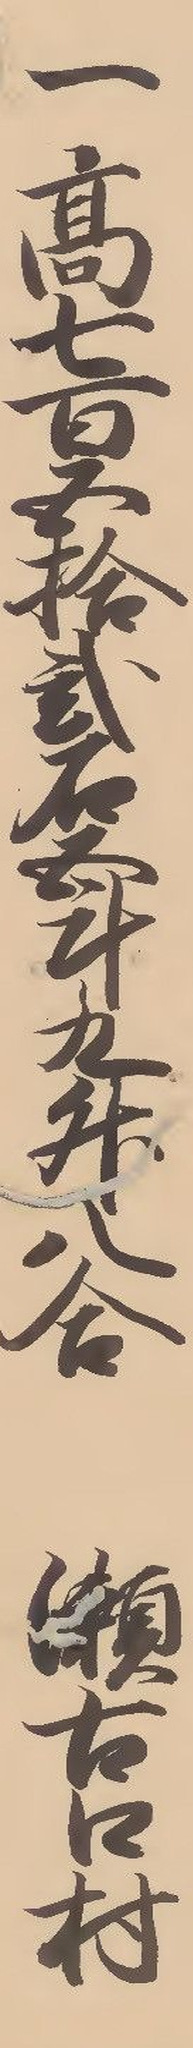一高七百五拾弐石五斗九升八合瀬古口村
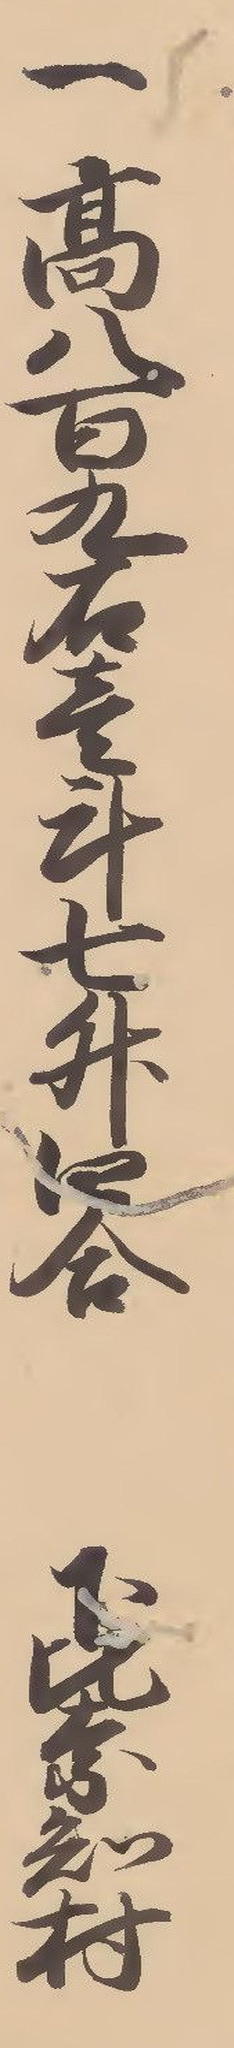一高八百九石壱斗七升四合下比奈知村
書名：伊賀国郷帳
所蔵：国立公文書館 National Archives of Japan
